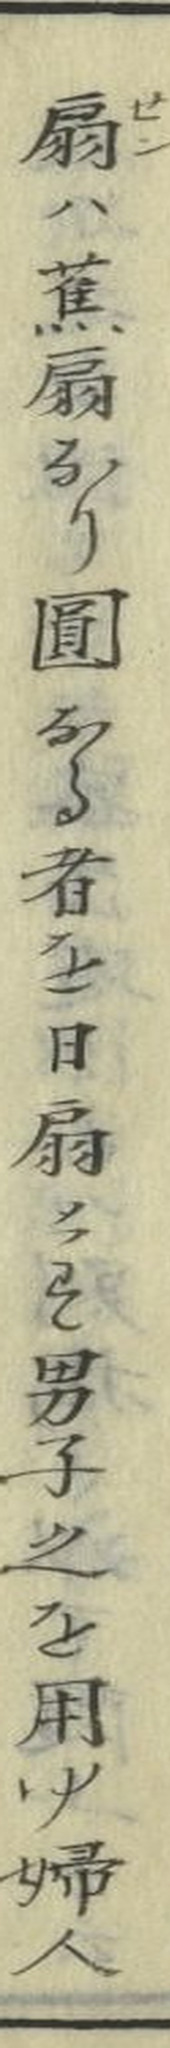扇は蕉扇なり円なる者を日扇とす男子之を用ゆ婦人
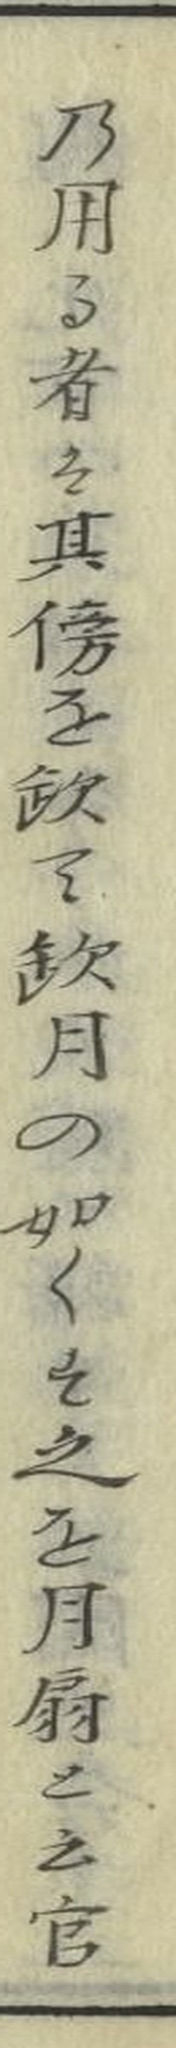の用る者は其傍を欫て欫月の如くす之を月扇と云官
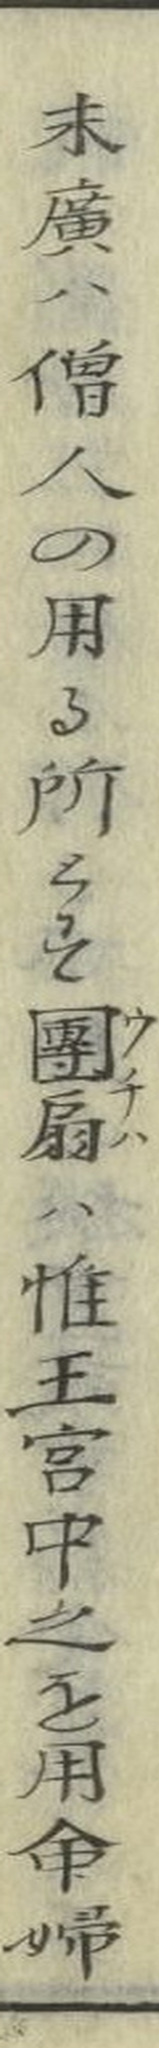末広は僧人の用る所とす団扇は惟王宮中之を用命婦
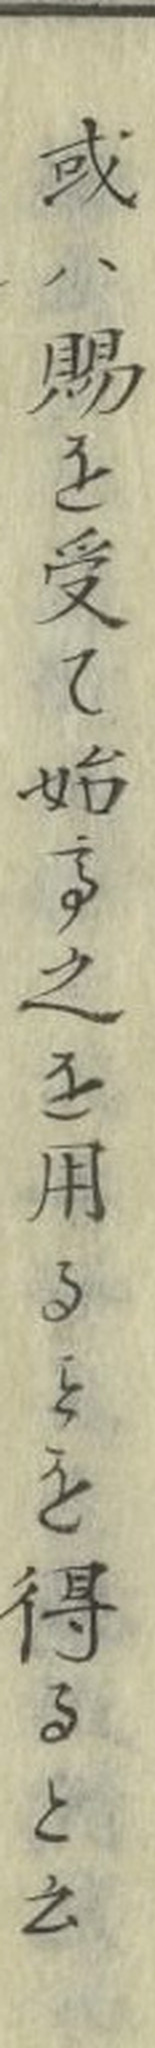或は賜を受て始て之を用ることを得ると云
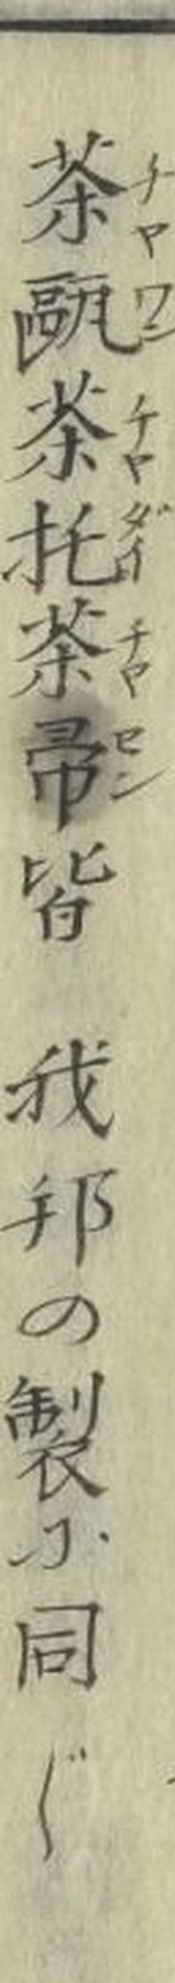茶碗茶托茶帚皆我邦の製に同じ
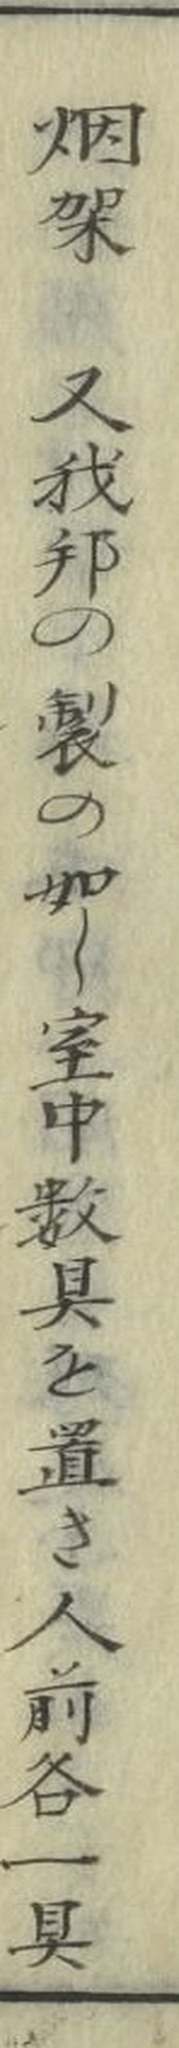烟架又我邦の製の如し室中数具を置き人前各一具

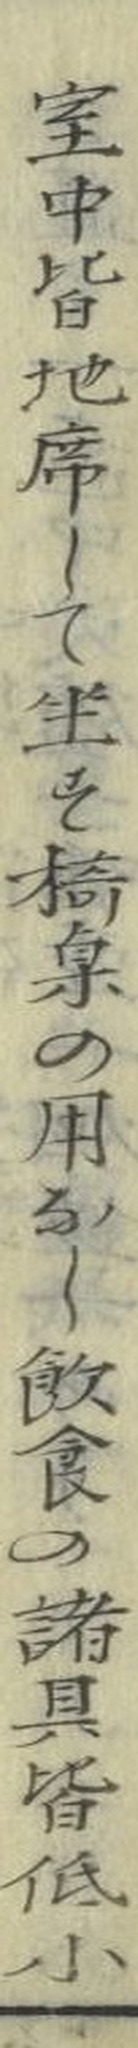室中皆地席して坐す椅桌の用なし飲食の諸具皆低小
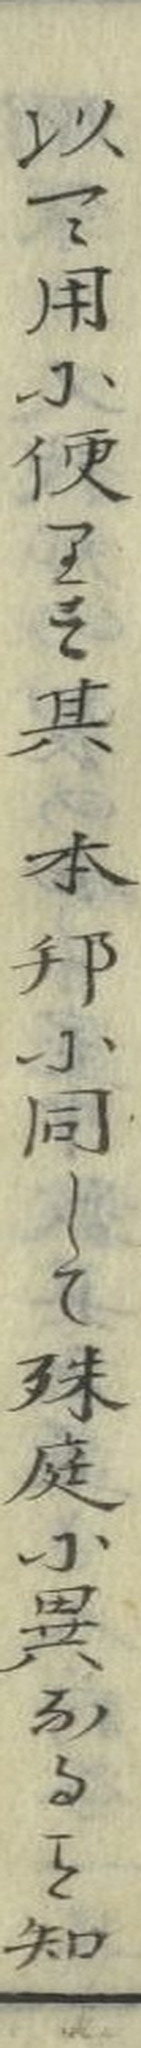以て用に便りす其本邦に同して殊庭に異なること知
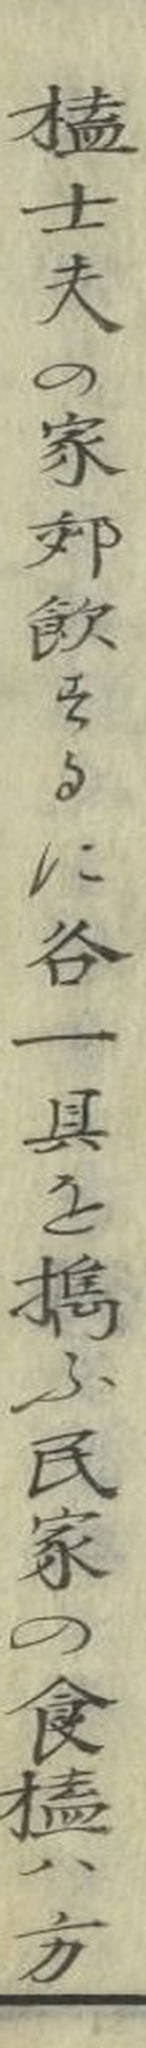榼士夫の家郊飲するに各一具を携ふ民家の食榼は方
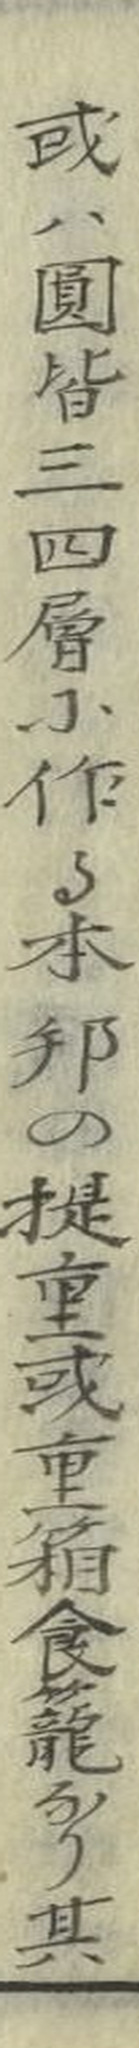或は円皆三四層に作る本邦の提重或重箱食籠なり其
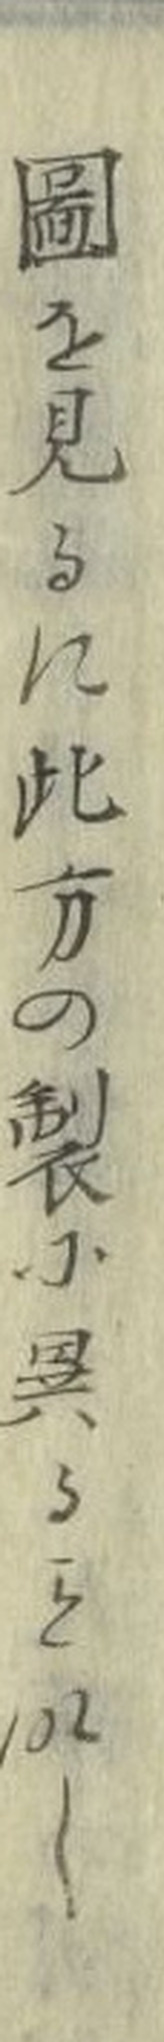図を見るに此方の製に異ることなし
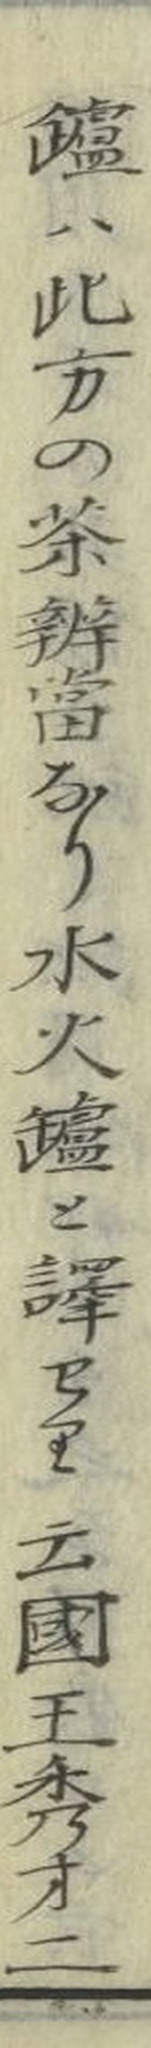罏は此方の茶弁当なり水火罏と訳せり云国王秀才二
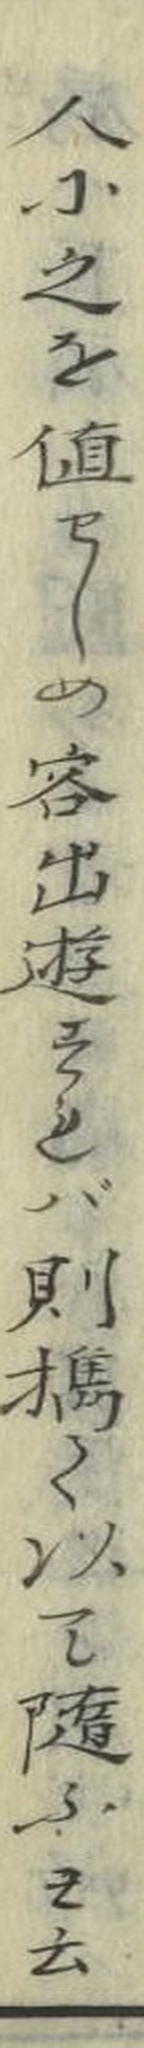人に之を値せしめ客出遊すれば則携て以て随ふと云
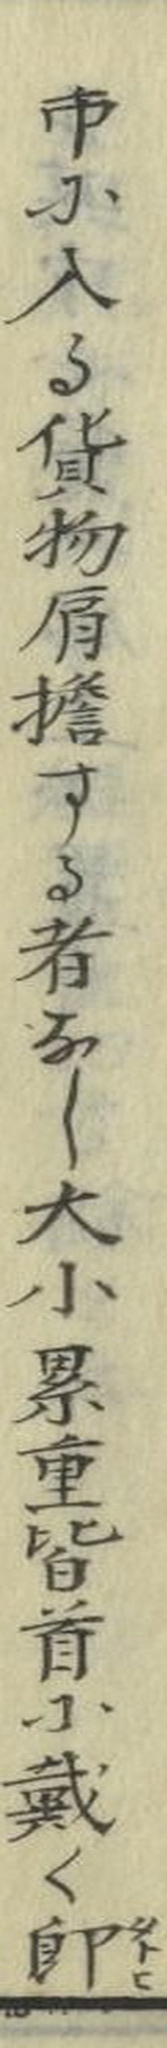市に入る貨物肩担する者なし大小累重皆首に戴く即
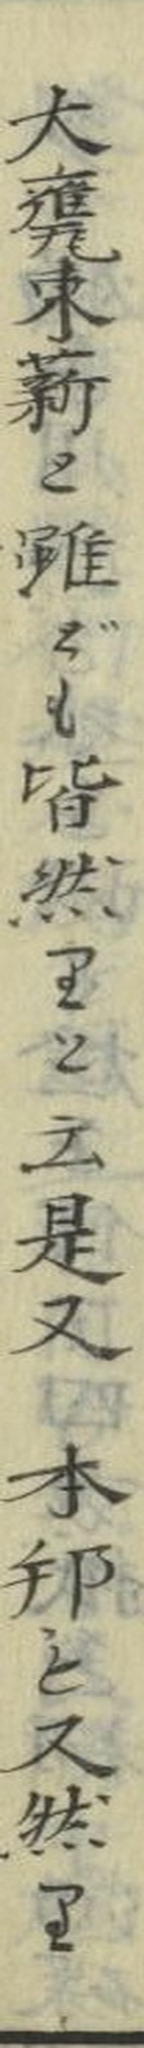大甕束薪と雖ども皆然りと云是又本邦も又然り
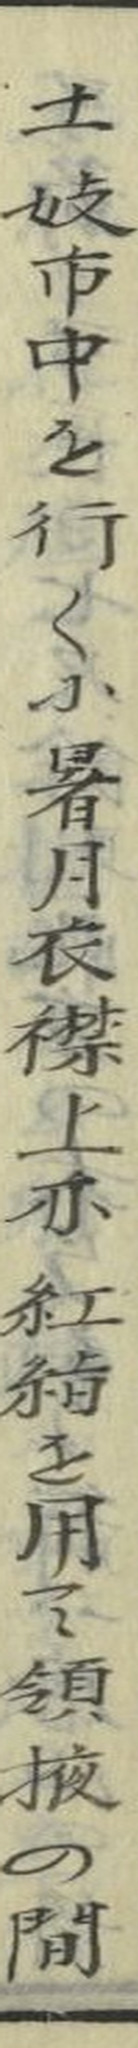土妓市中を行くに暑月衣襟上亦紅を用て領掖の間
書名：琉球沿革志 上
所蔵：University of the Ryukyus Library
